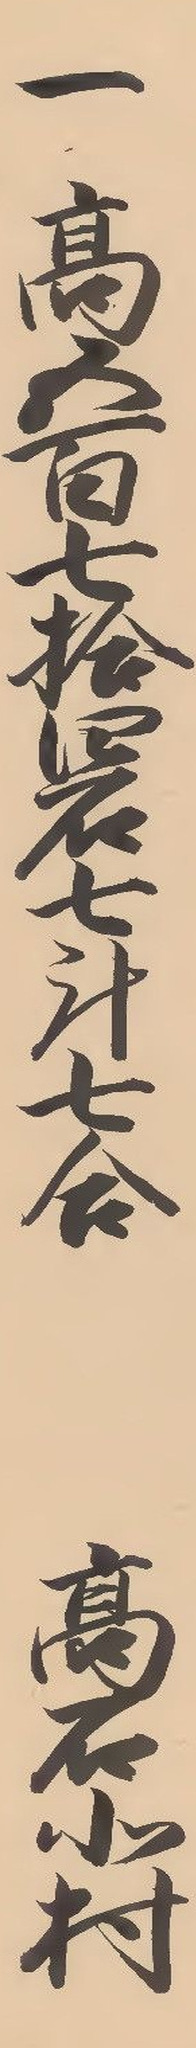一高五百七拾四石七斗七合高石北村

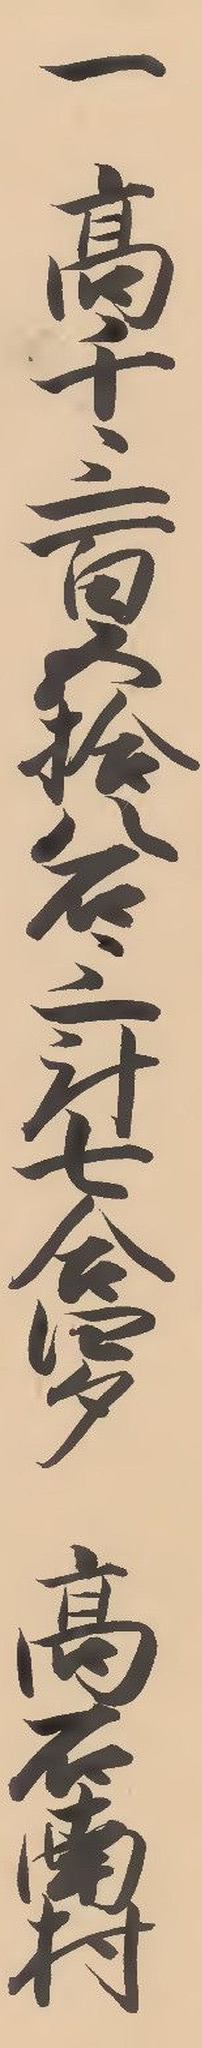一高千三百五拾八石三斗七合四勺高石南村
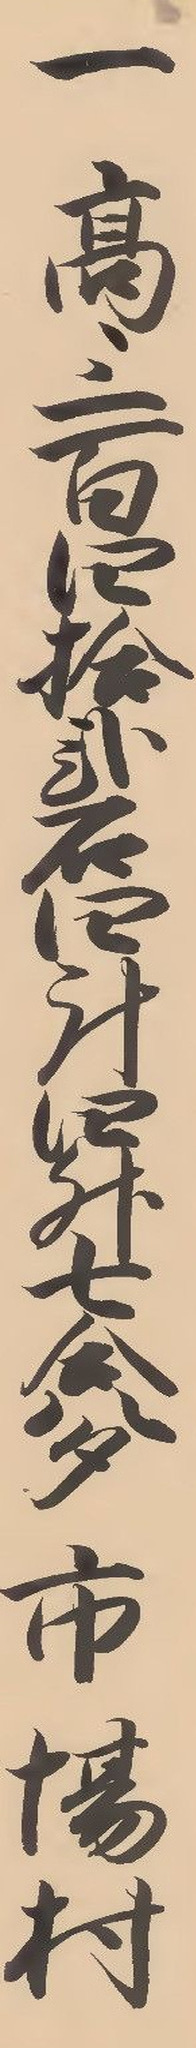一高三百四拾弐石四斗四升七合八勺市場村
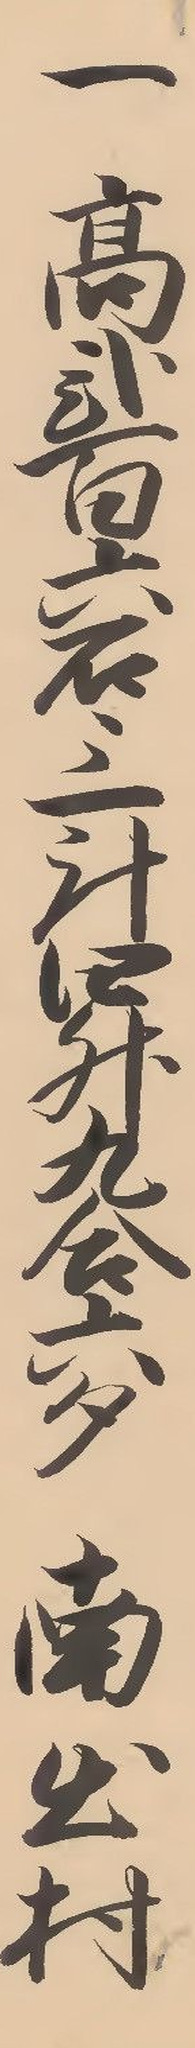一高弐百六石三斗四升九合六勺南出村
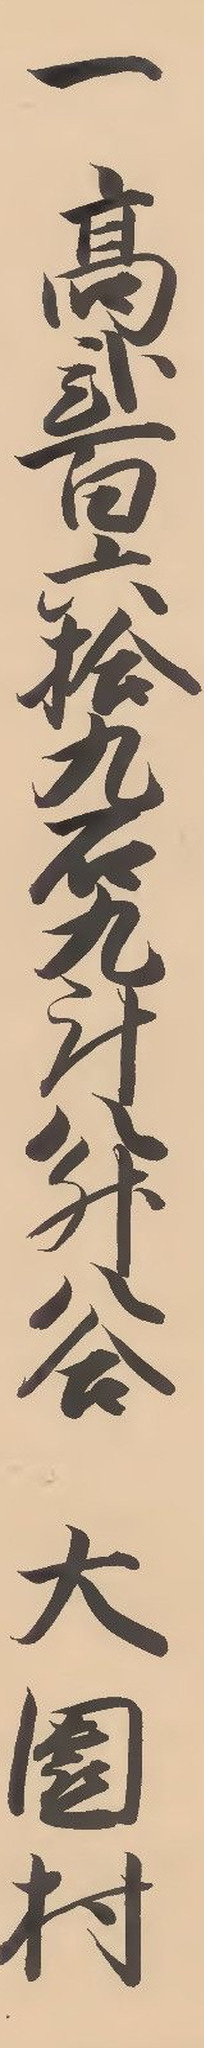一高弐百六拾九石九斗八升八合大園村
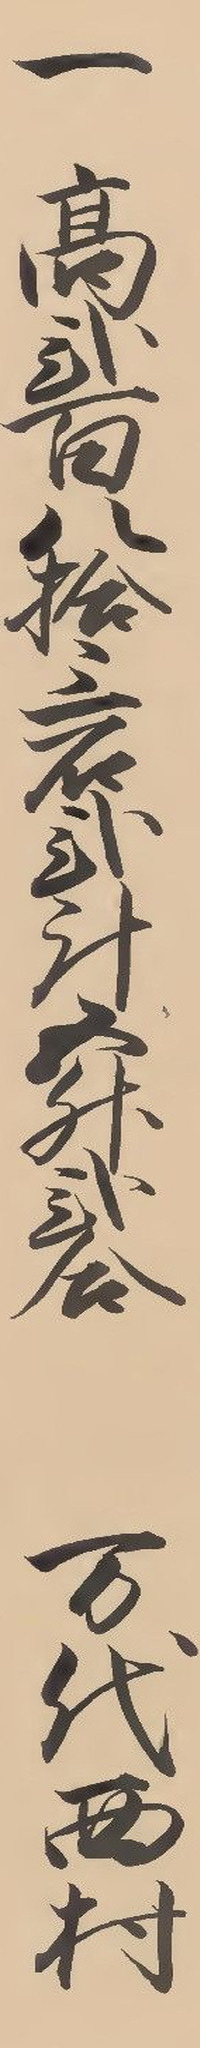一高弐百八拾三石弐斗五升弐合万代西村
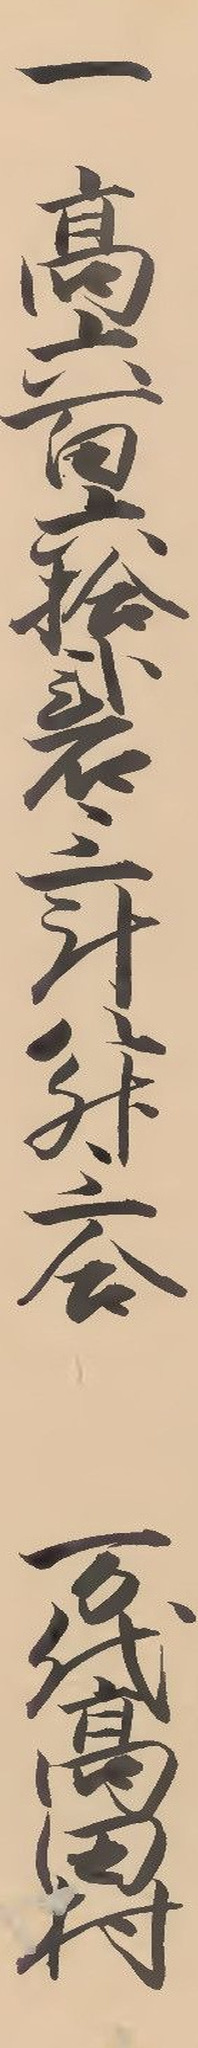一高六百六拾弐石三斗八升三合万代高田村
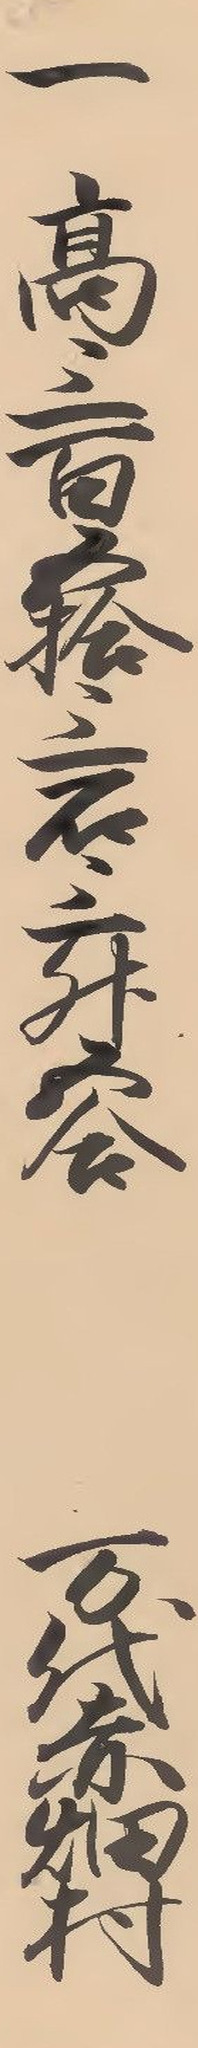一高三百五拾三石三升五合万代赤畑村
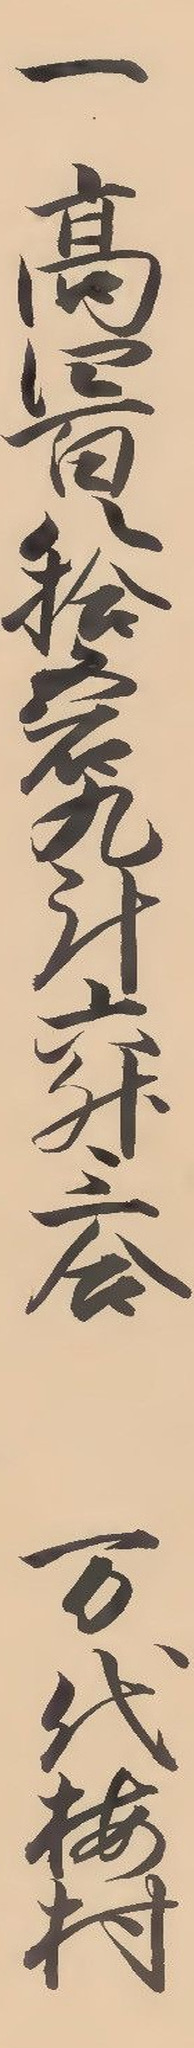一高四百八拾五石九斗六升三合万代梅村

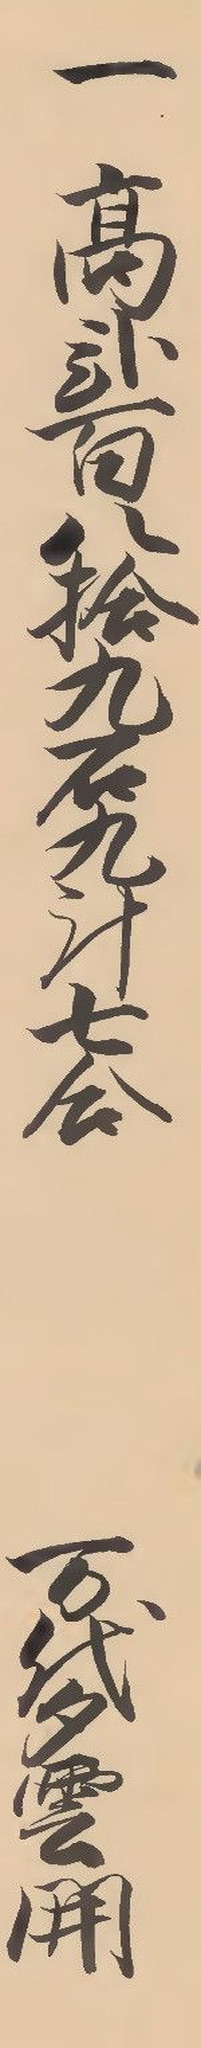一高弐百八拾九石九斗七合万代夕雲開
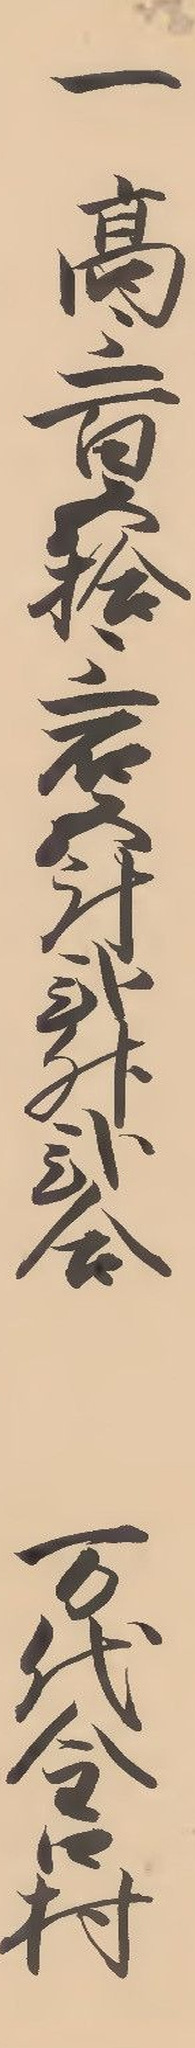一高三百五拾三石五斗弐升弐合万代金口村
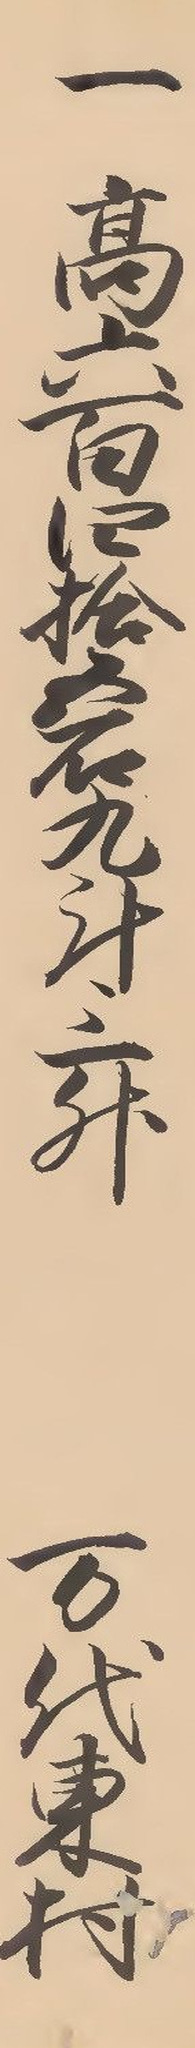一高六百四拾五石九斗三升万代東村
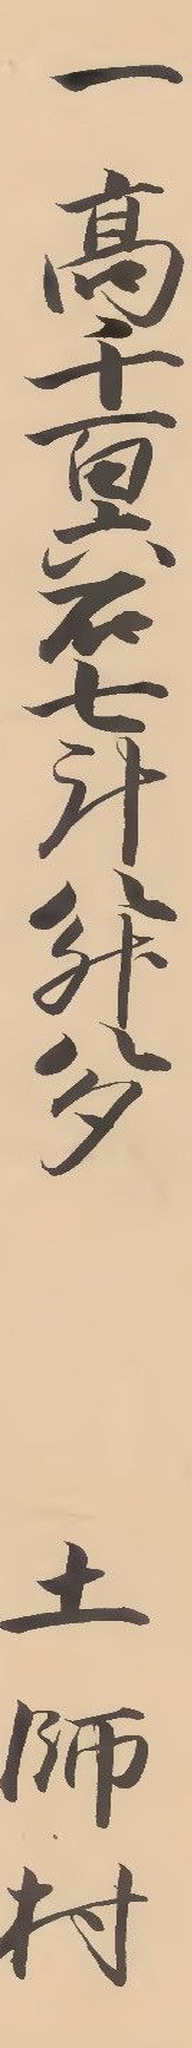一高千百六石七斗八升八勺土師村
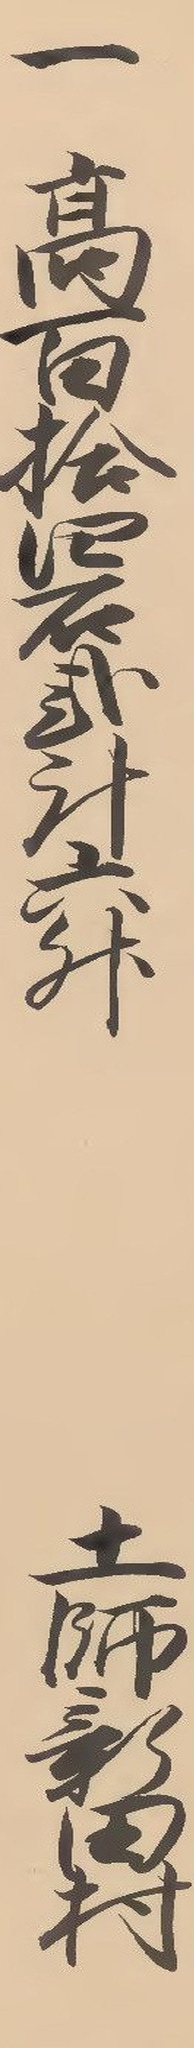一高百拾四石弐斗六升土師新田村
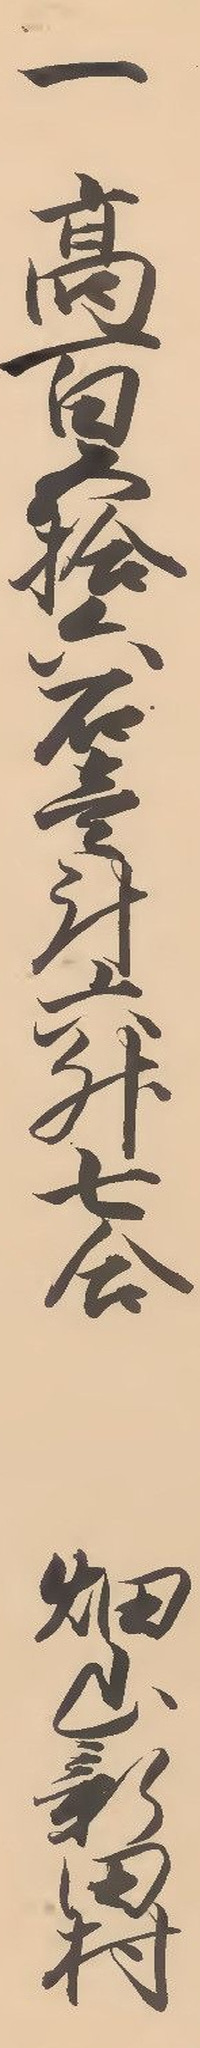一高百五拾六石壱斗六升七合畑山新田村
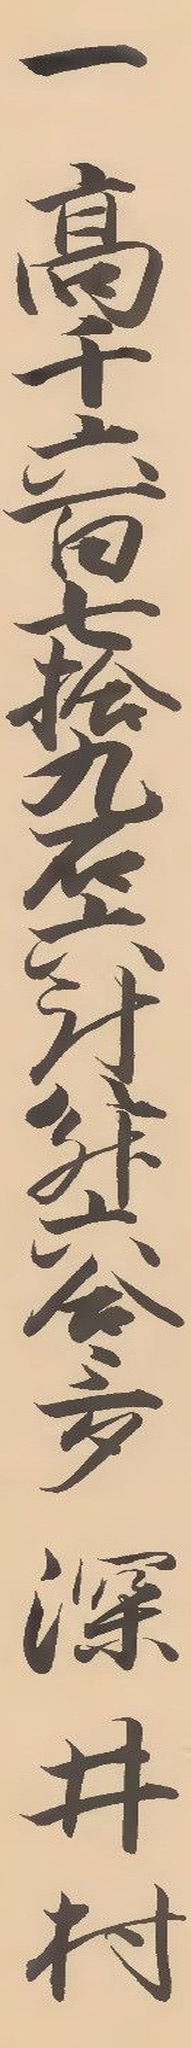一高千六百七拾九石六斗八升六合三勺深井村
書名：和泉国郷帳
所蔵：国立公文書館 National Archives of Japan
